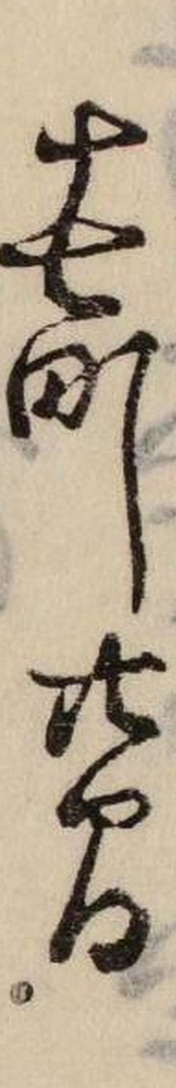十七町廿間
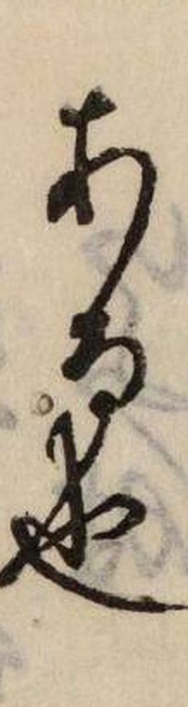ある也

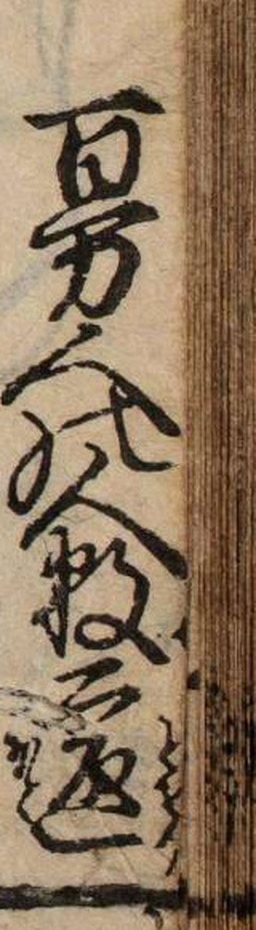百万人の人数通
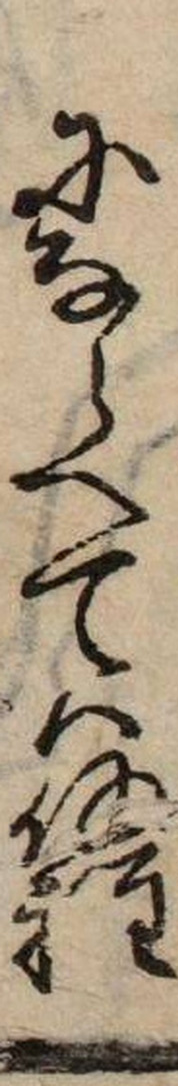にならへてハ何程
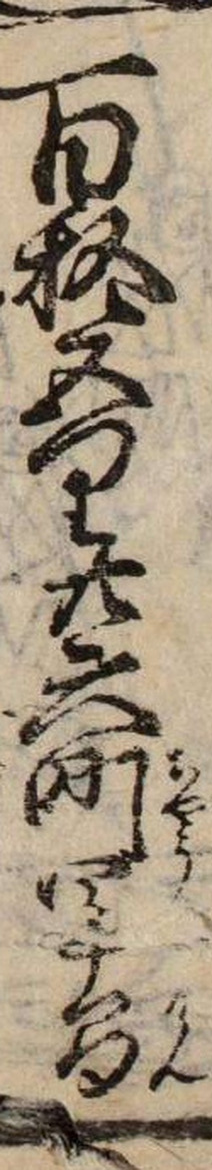百拾五里廿六町四十間
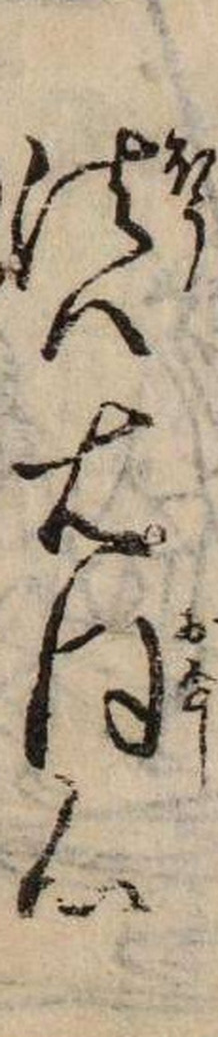法ハ右同心

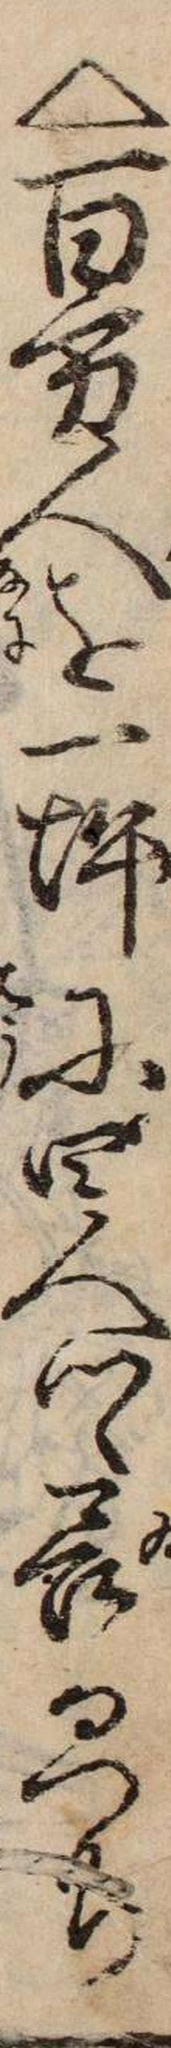△百万人を一坪に四人つゝ居るつもり
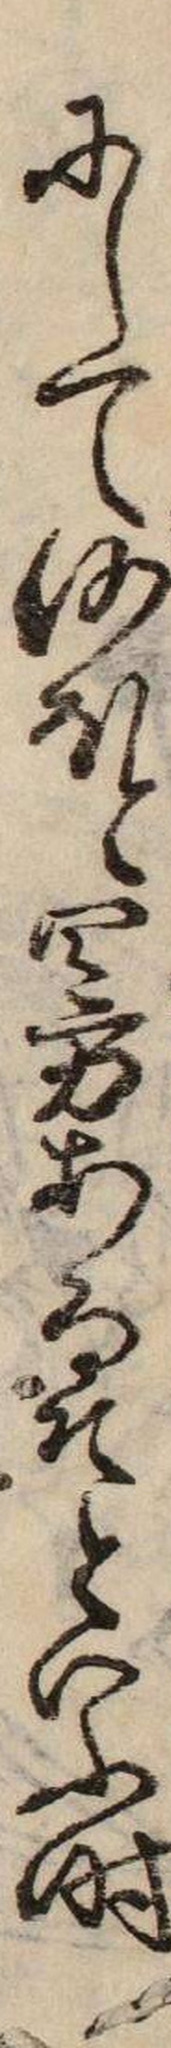にして何ほと四方あるそといふ時
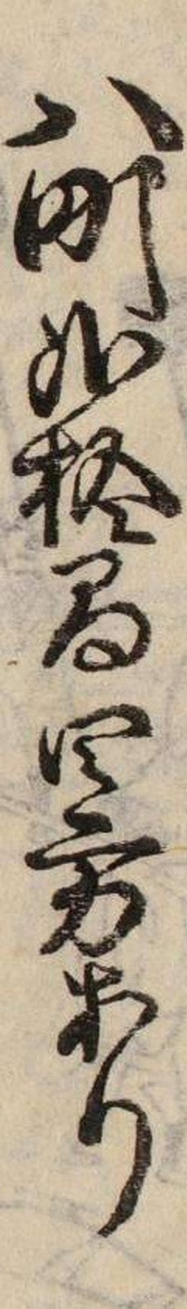八町弐拾間四方あり
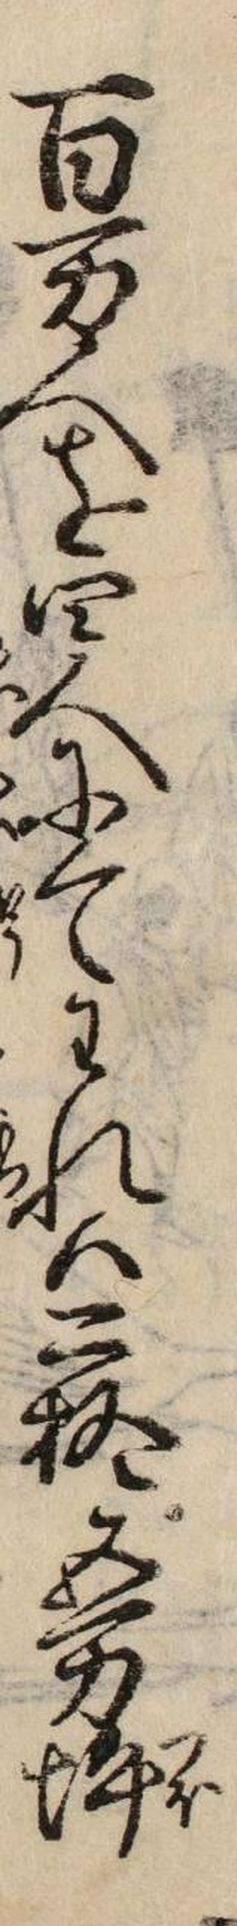百万人を四人にてわれは二拾五万坪
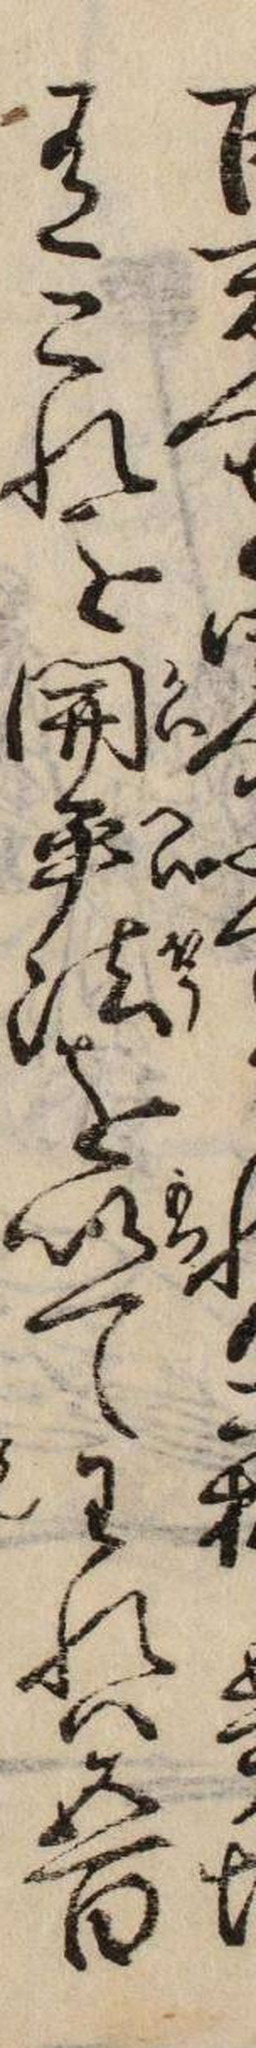有これを開平法を以てわれは五百
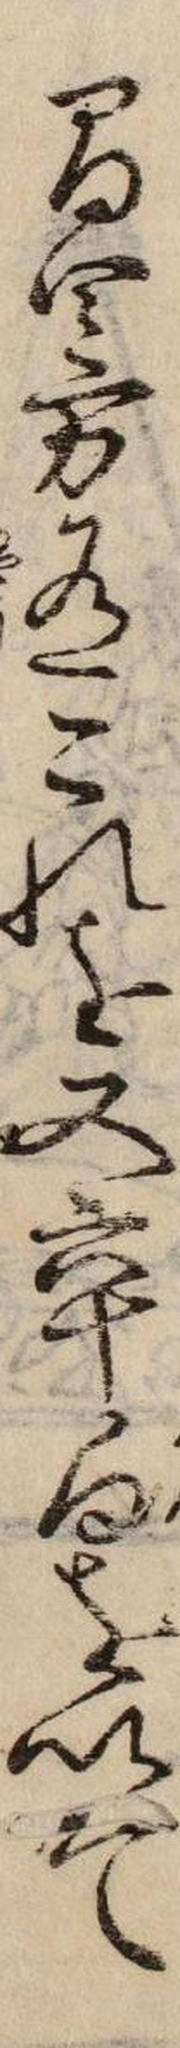間四方有これを又六千間を以て
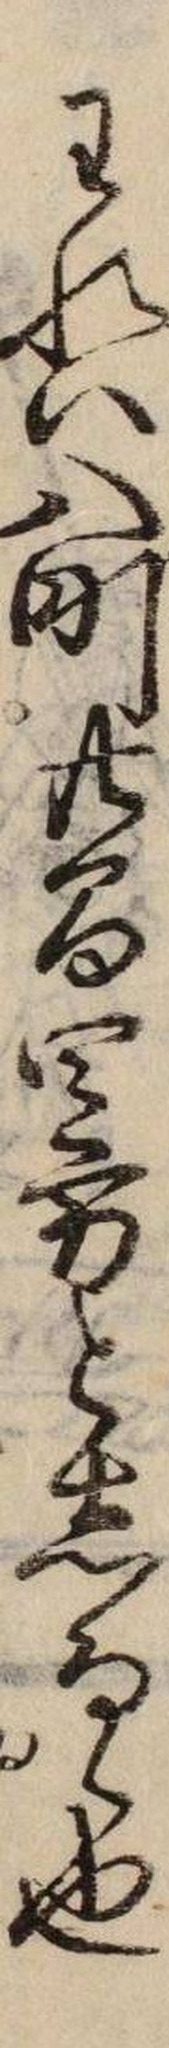われは八町廿間四方としる也
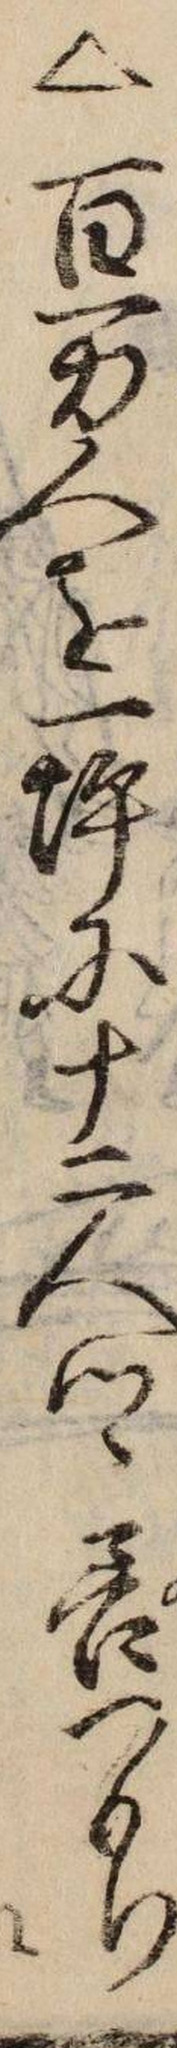△百万人を一坪に十二人つつ居つもり
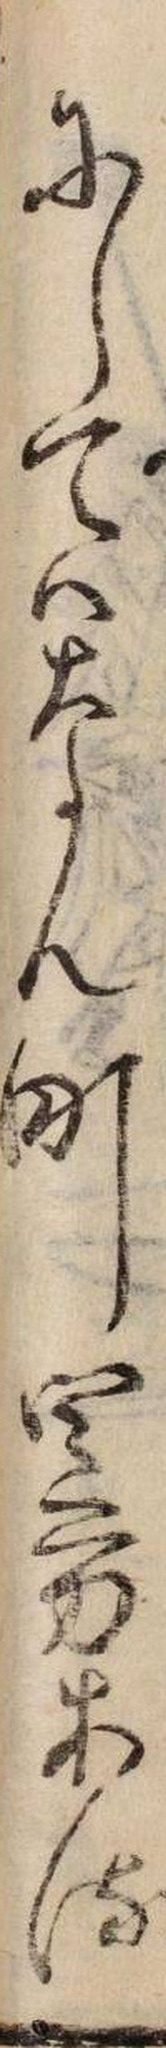にしてはなん町四方ある
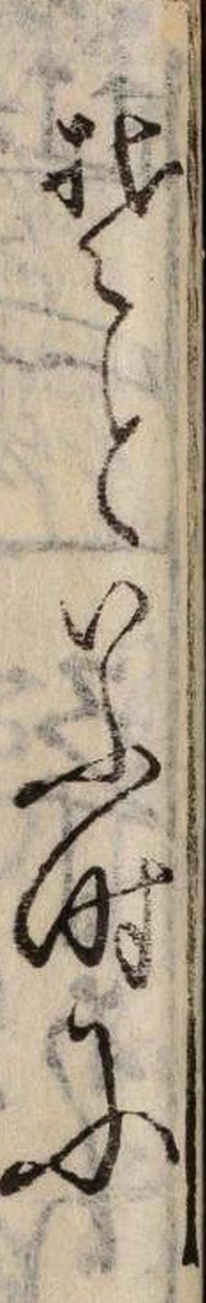そといふ時に
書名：塵劫記（寛永11年自跋、京都府立京都学・歴彩館追貴8）
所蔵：京都府立京都学・歴彩館 国文学研究資料館
